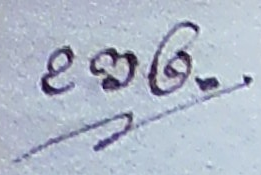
236.
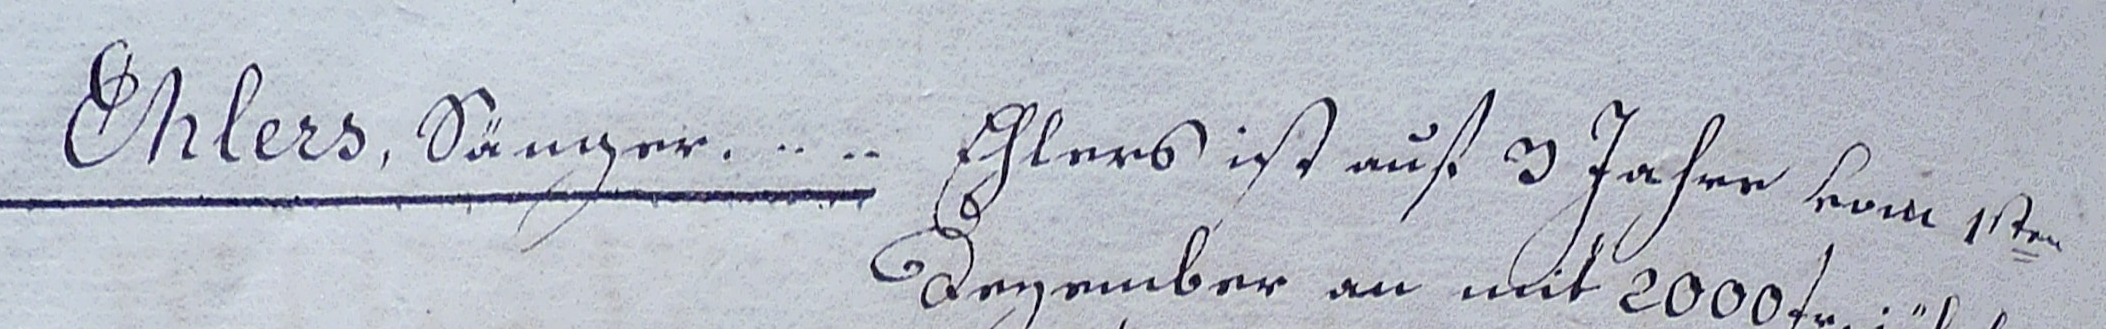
Ehlers, Sänger. .. .. Ehlers ist auf 3 Jahre vom 1ste͇n
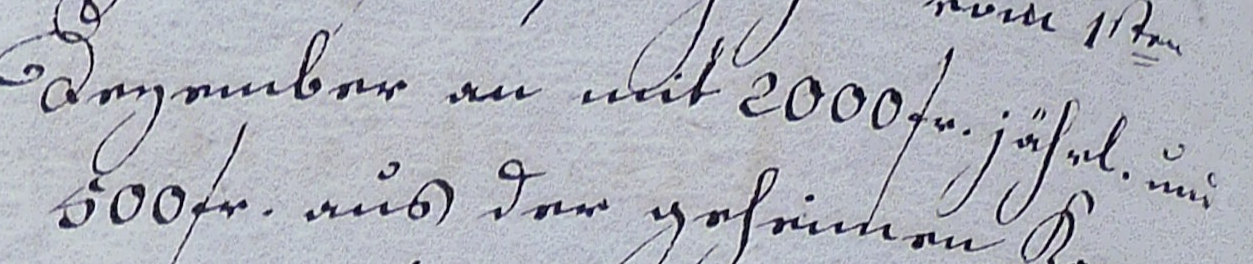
Dezember an mit 2000fr. Jährl, um
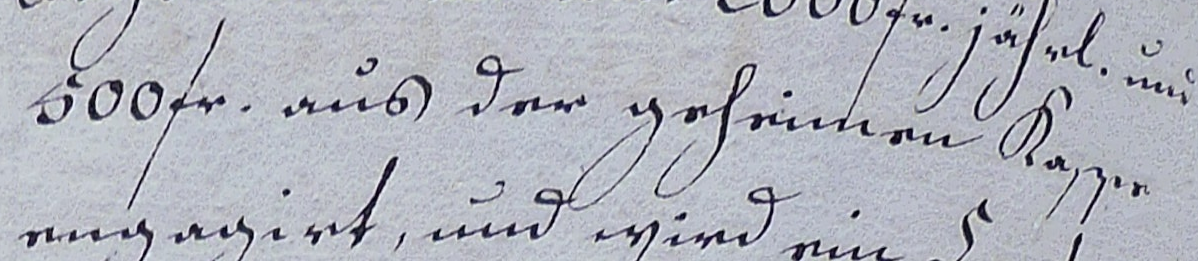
500fr. aus der geheimen Kasse
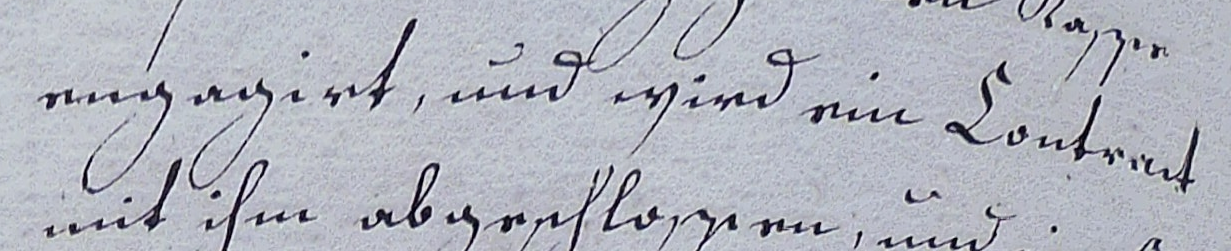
engagirt, und wird ein Contract
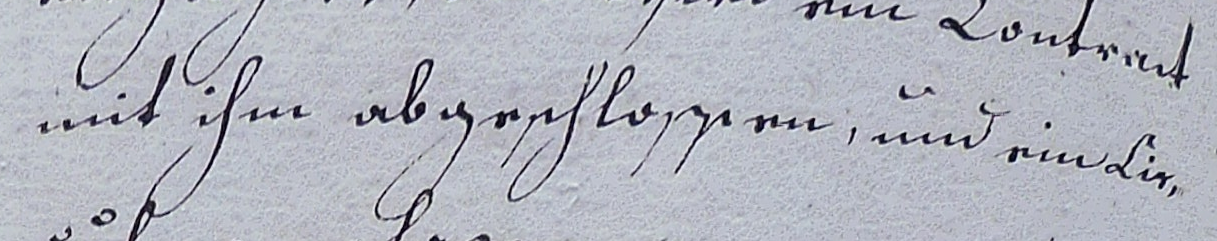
mit ihm abgeschlossen, und ein Cir¬
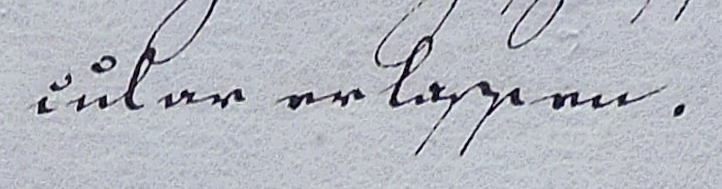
cular erlassen.
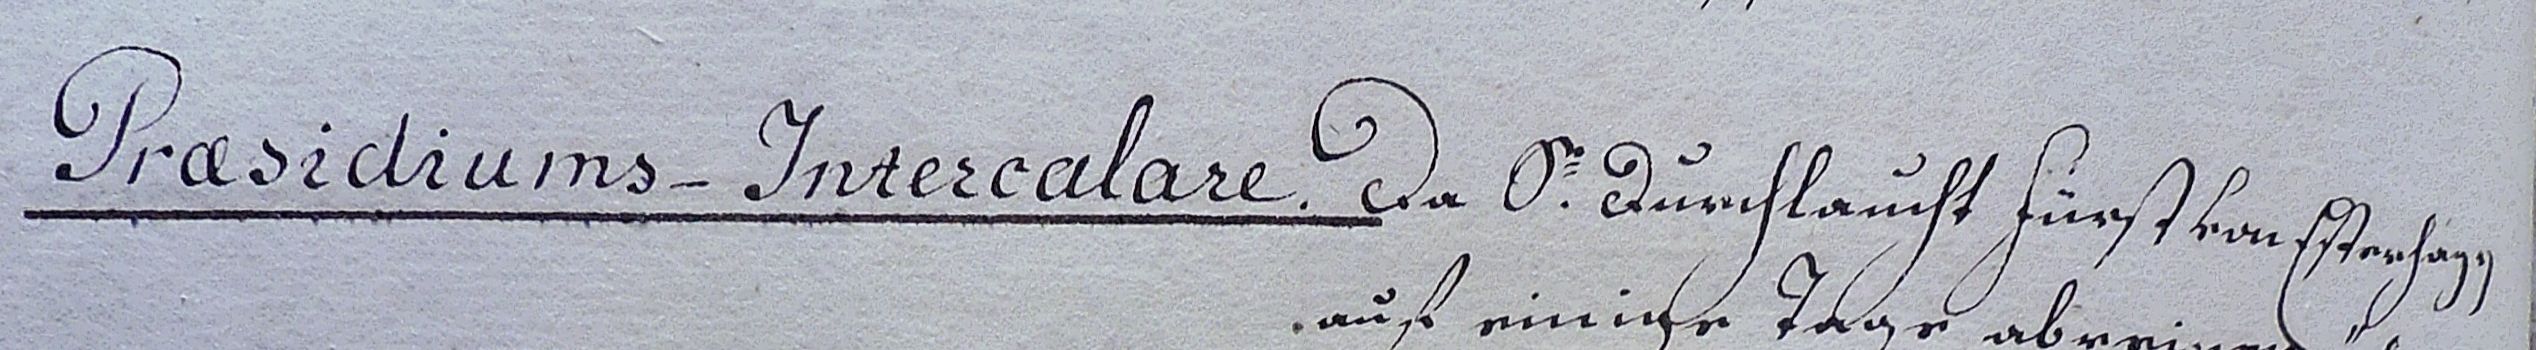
Præsidiums-Intercalare. Da Se͇. Durchlaucht Fürst von Esterházy
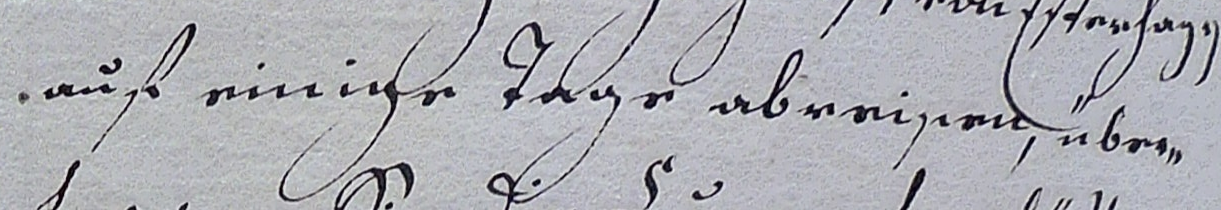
auf einige Tage abreisen, über¬
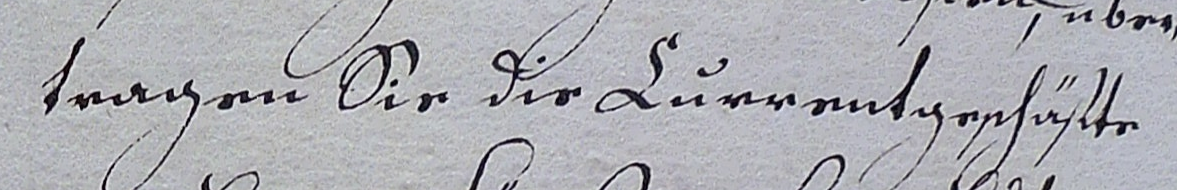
tragen Sie die Currentgeschäfte
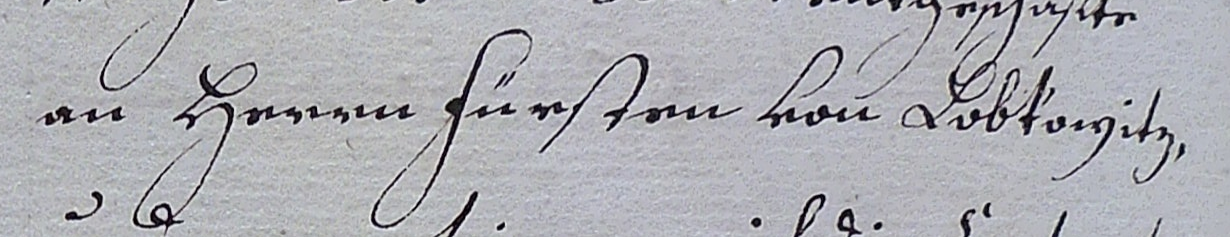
an Herrn Fürsten von Lobkowitz,
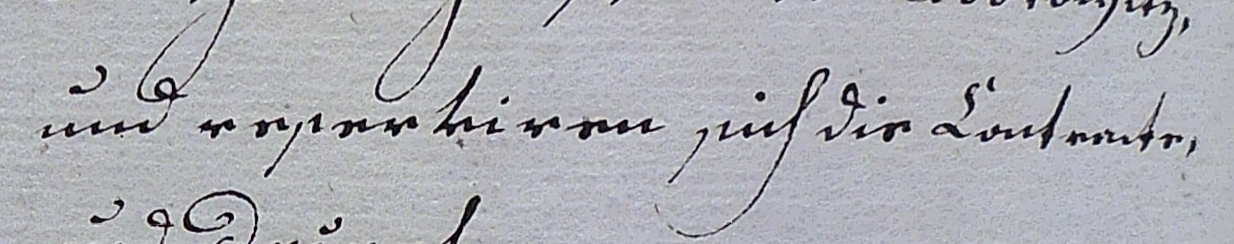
und reserviren sich die Contracte,
